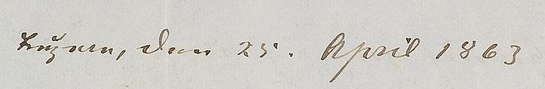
Luzern, den 25. April 1863
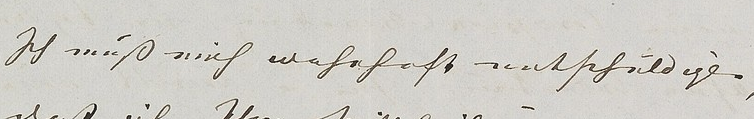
Ich muss mich wahrhaft entschuldigen,
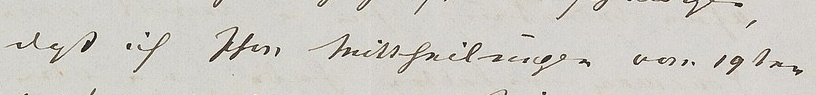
daß ich Ihre Mittheilungen vom 19ten
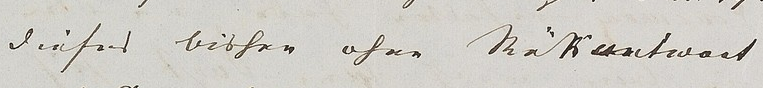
dieses bisher ohne Rükantwort
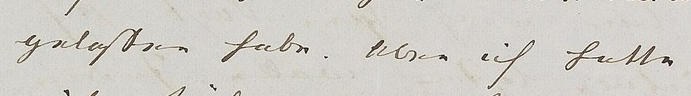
gelassen habe. Aber ich hatte
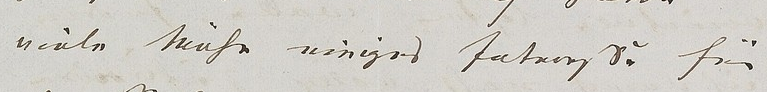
viele Mühe einiges Interesse für
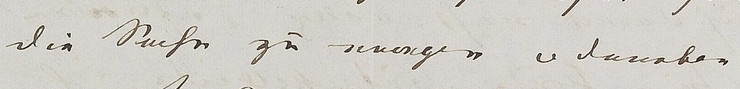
die Sache zu erregen & daneben
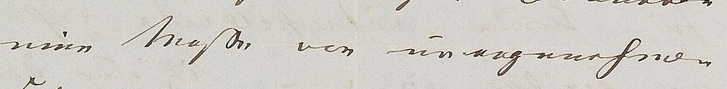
eine Masse von unangenehmen
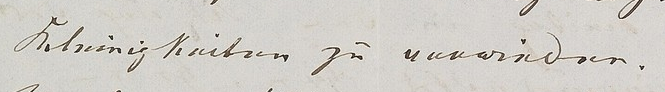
Kleinigkeiten zu verwinden.
